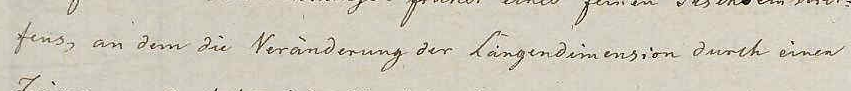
fens, an dem die Veränderung der Längendimension durch einen
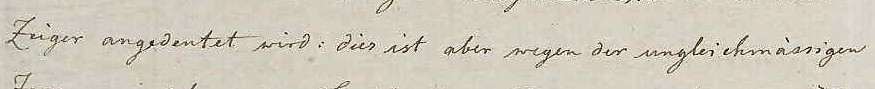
Zeiger angedeutet wird: dies ist aber wegen der ungleichmässigen
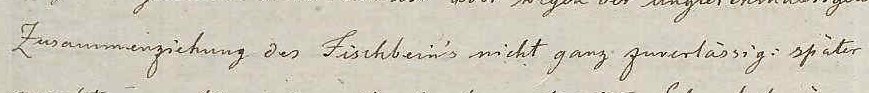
Zusammenziehung des Fischbein's nicht ganz zuverlässig: später
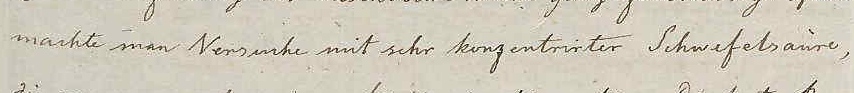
machte man Versuche mit sehr konzentrirter Schwefelsäure,
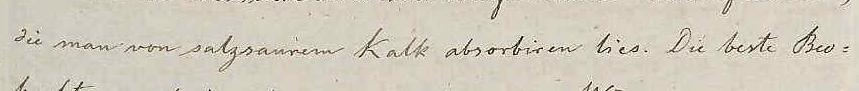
die man von salzsaurem Kalk absorbiren lies. Die beste Beo-
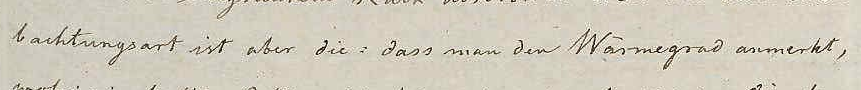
bachtungsart ist aber die: dass man den Wärmegrad anmerkt,
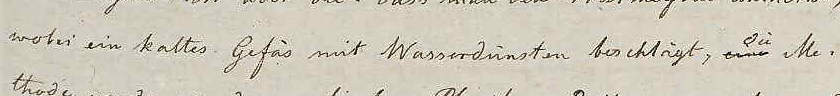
wobei ein kaltes Gefäs mit Wasserdünsten beschlägt, einedie Me-
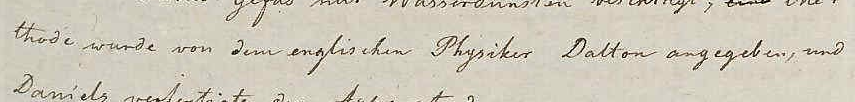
thode wurde von dem englischen Physiker Dalton angegeben, und
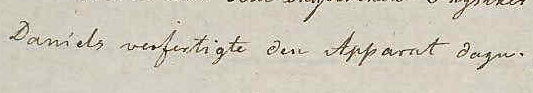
Daniels verfertigte den Apparat dazu.
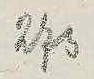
erhizt,
